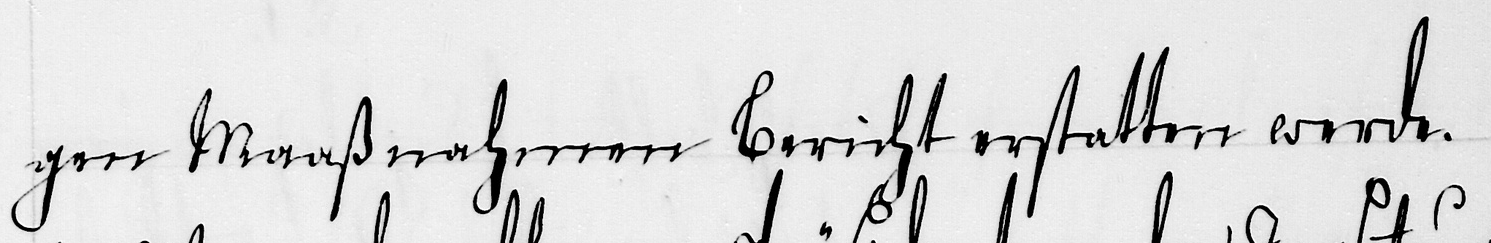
gen Maaßnahmen Bericht erstatten werde.
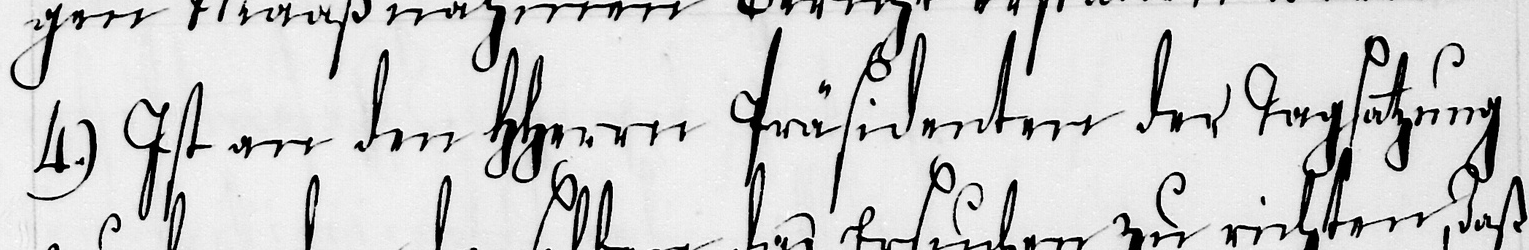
4.) Ist an den HHerrn Präsidenten der Tagsatzung
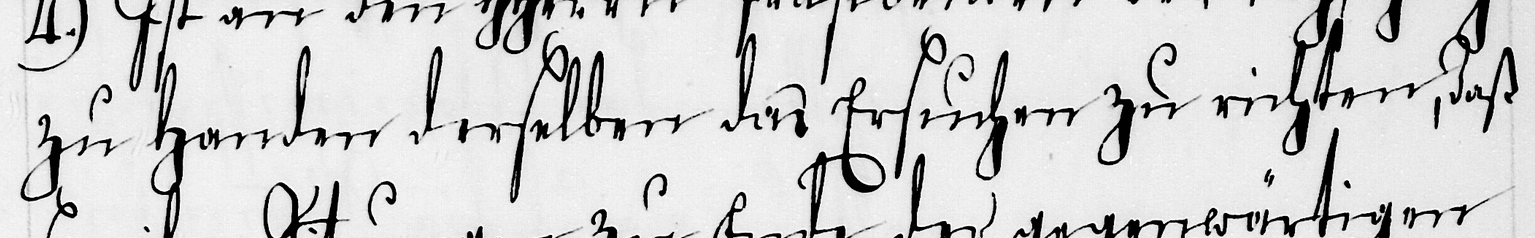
zu Handen derselben das Ersuchen zu richten, daß
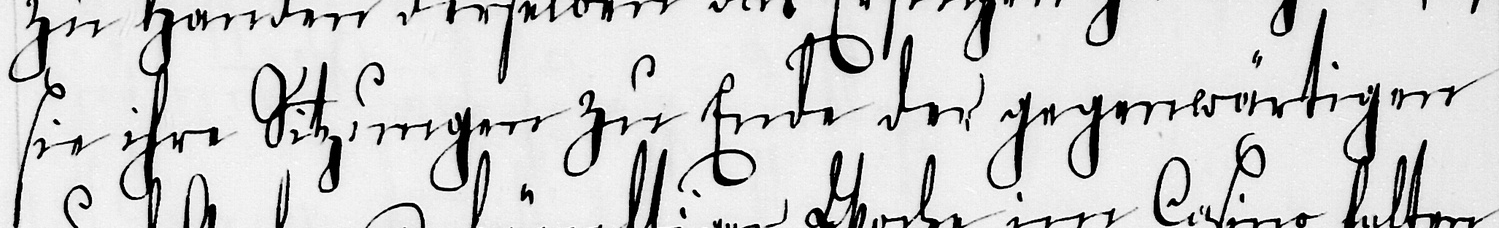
sie ihre Sitzungen zu Ende der gegenwärtigen
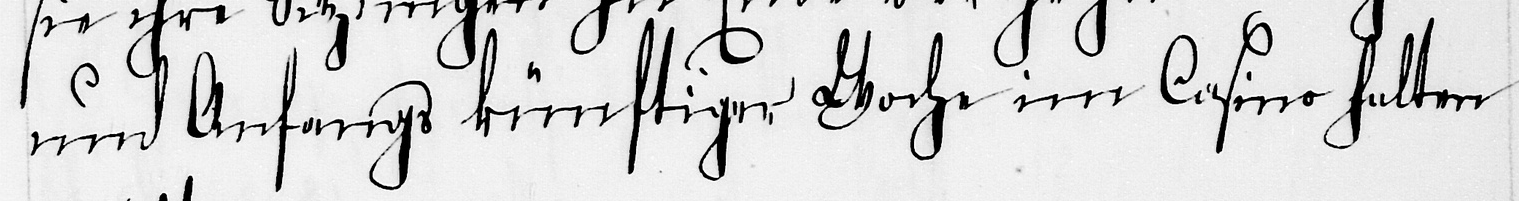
und Anfangs künftiger Woche im Casino halten
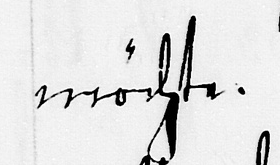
möchte.
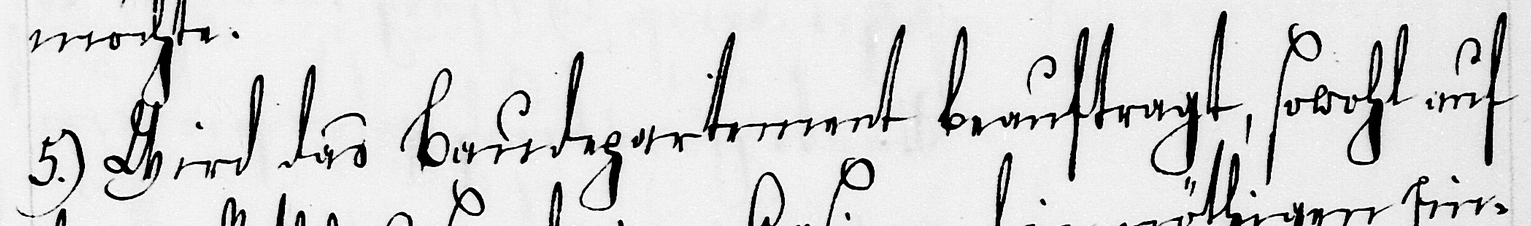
5.) Wird das Baudepartement beauftragt, sowohl auf
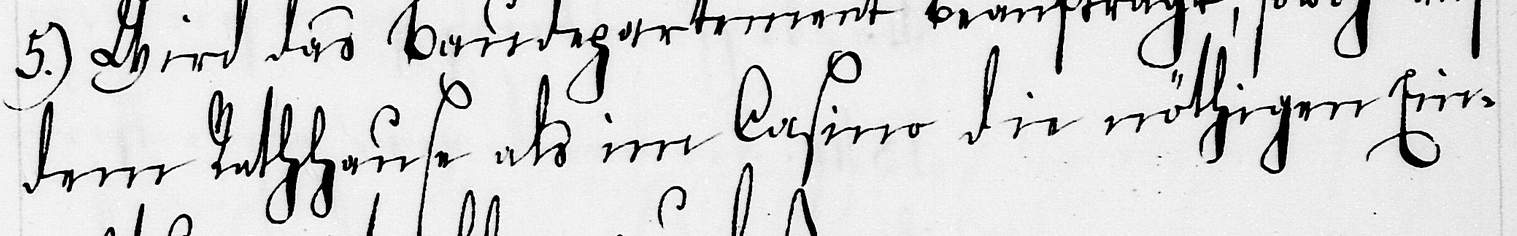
dem Rathhause als im Casino die nöthigen Ein¬
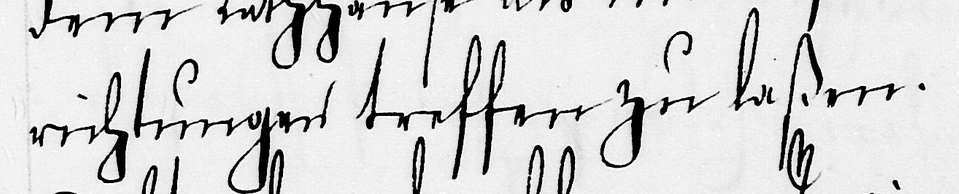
richtungen treffen zu laßen.
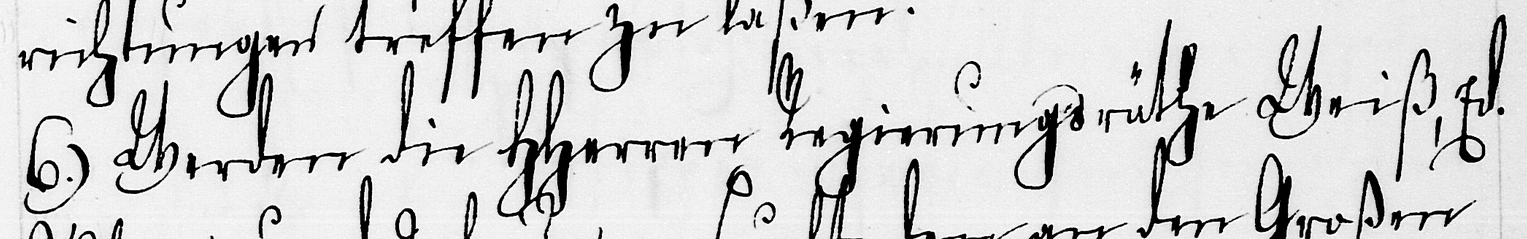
6.) Werden die HHerren Regierungsräthe Weiß, Ed.
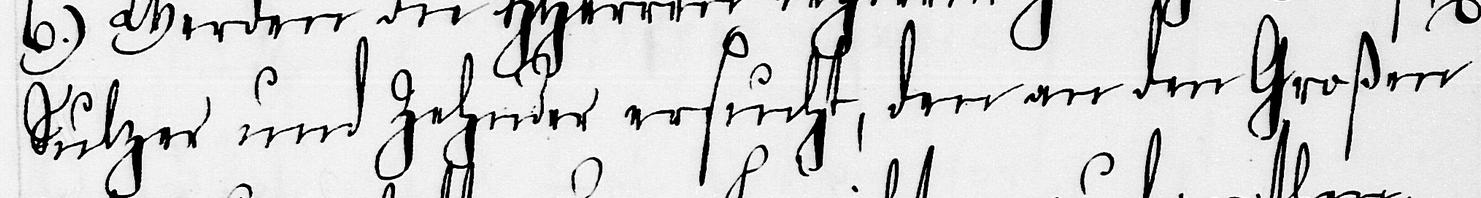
Sulzer und Zehnder ersucht, den an den Großen
